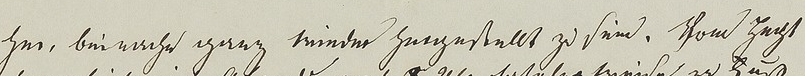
her, beinahe ganz wieder hergestellt zu sein. Vom Hecht
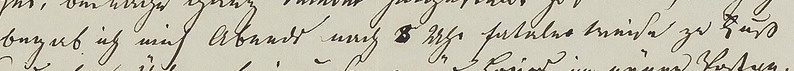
begab ich mich Abends nach 8 Uhr fataler Weise zu Fuß
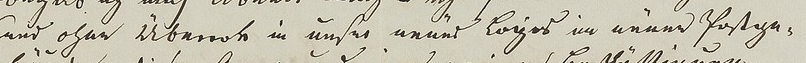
(und ohne Überrok ) in unser neues Logis im neuen Postge-
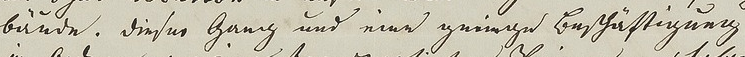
bäude. Dieser Gang und eine geringe Beschäftigung
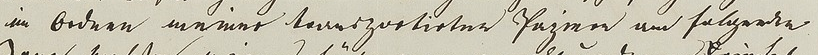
im Ordnen meiner transportirten Papiere am folgenden
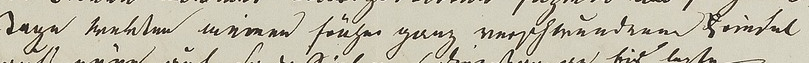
Tage wekten meinen früher ganz verschwundenen Friesel
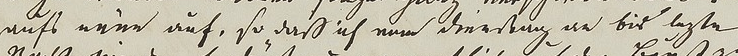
aufs neue auf, so daß ich vom Dienstag an bis lezte
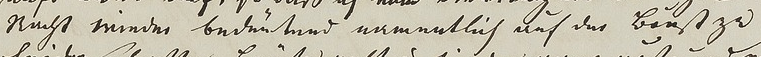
Nacht wieder bedeutend namentlich auf der Brust zu
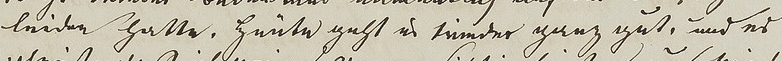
leiden hatte. Heute geht es wieder ganz gut, und es
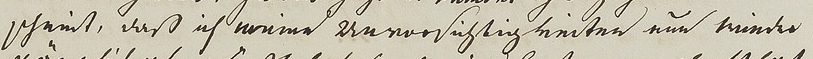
scheint, daß ich meine Unvorsichtigkeiten nun wieder
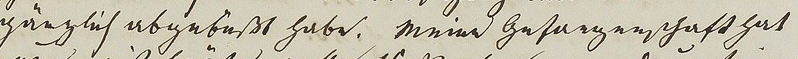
gänzlich abgebüßt habe. Meine Gefangenschaft hat
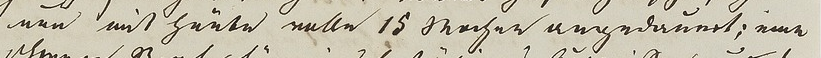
nun mit heute volle 15 Wochen angedauert; eine
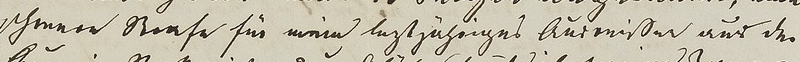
schwere Strafe für mein leztjähriges Ausreissen aus der
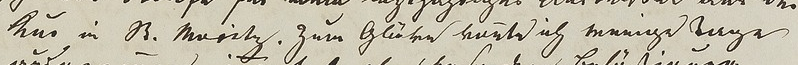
Kur in St. Moritz. Zum Glüke konnte ich wenige Tage
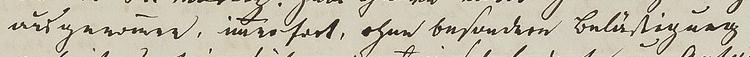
ausgenommen, immerfort, ohne besondere Belästigung
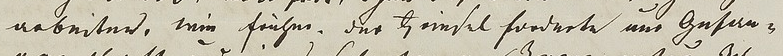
arbeiten, wie früher. Der Friesel forderte nur Gefan-
